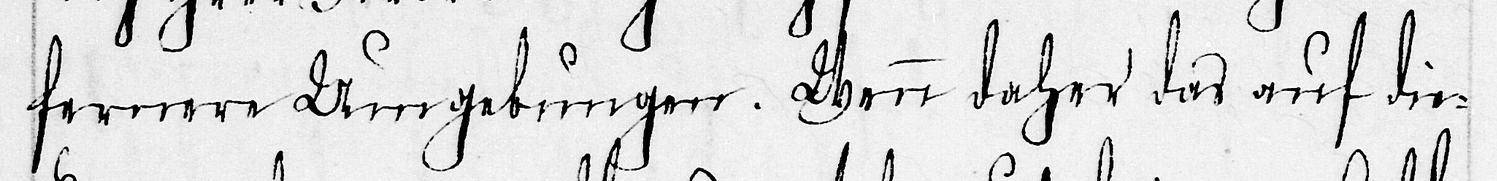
fernere Umgebungen. Wenn daher das auf die¬
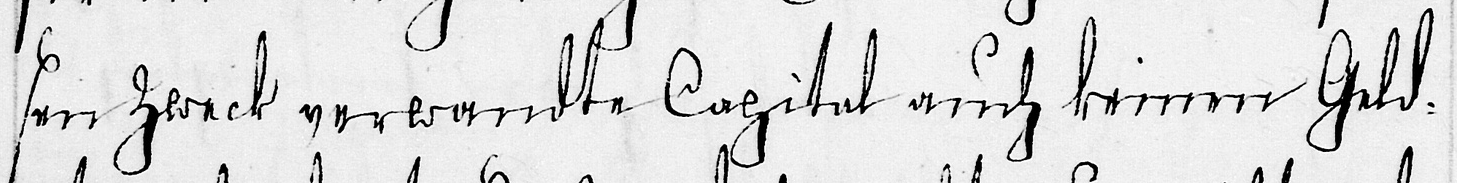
sen Zweck verwandte Capital auch keinen Geld¬
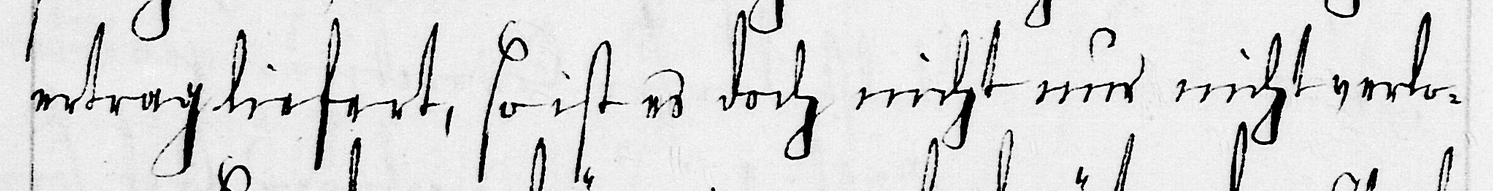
ertrag liefert, so ist es doch nicht nur nicht verlo¬
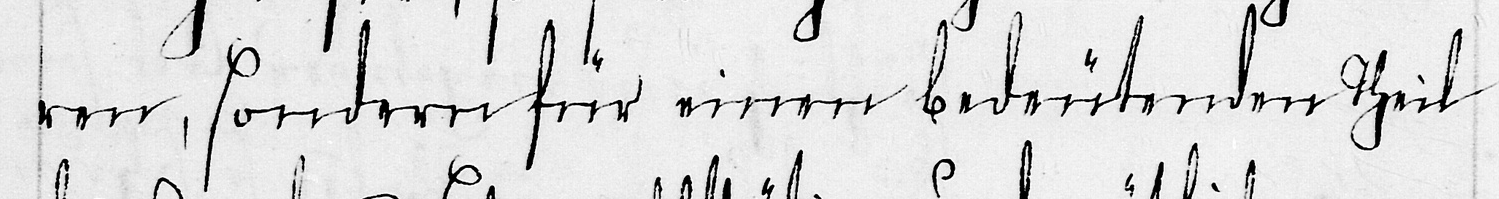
ren, sondern für einen bedeutenden Theil
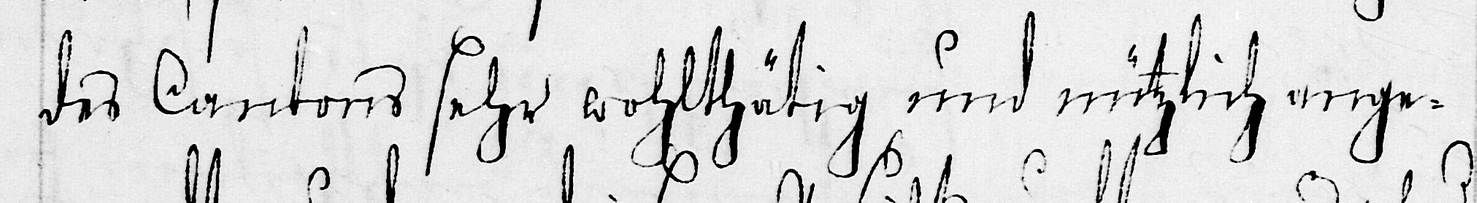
des Cantons sehr wohlthätig und nützlich ange¬
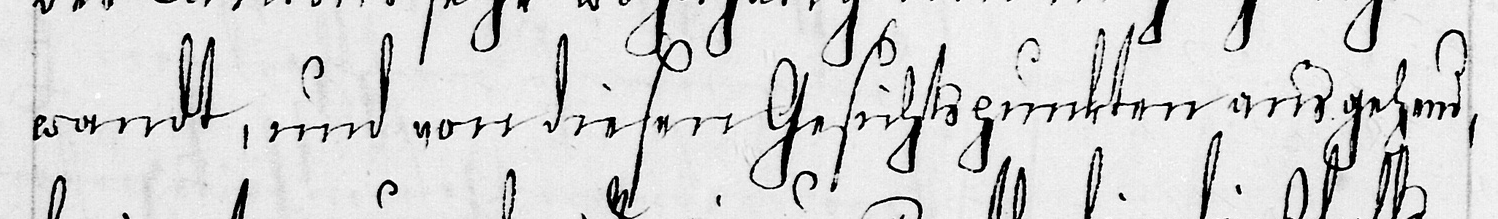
wandt, und von diesen Gesichtspunkten ausgehend,
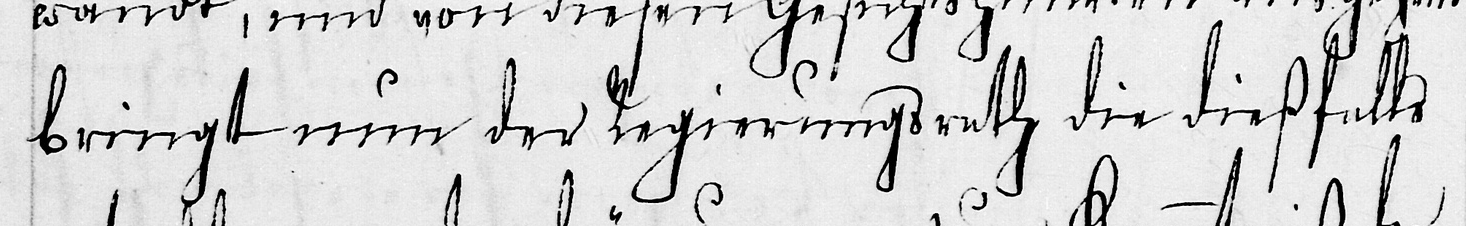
bringt nun der Regierungsrath die dießfalls
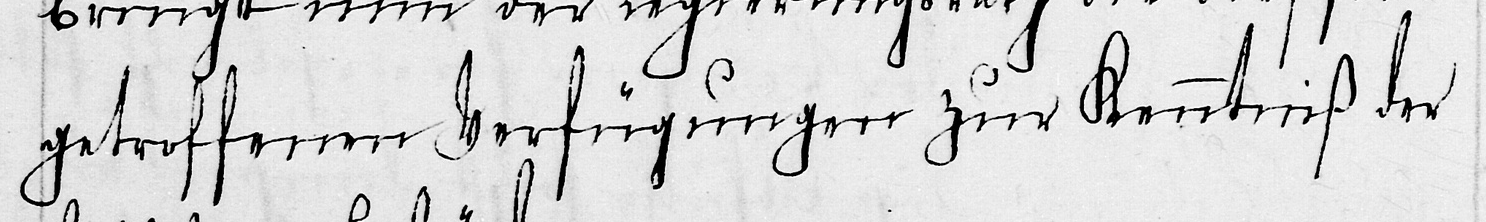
getroffenen Verfügungen zur Kenntniß der
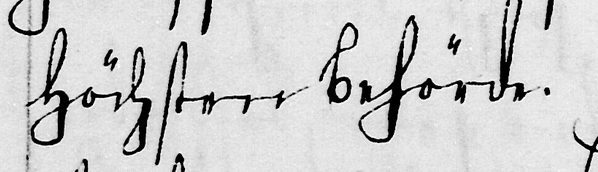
Höchsten Behörde.
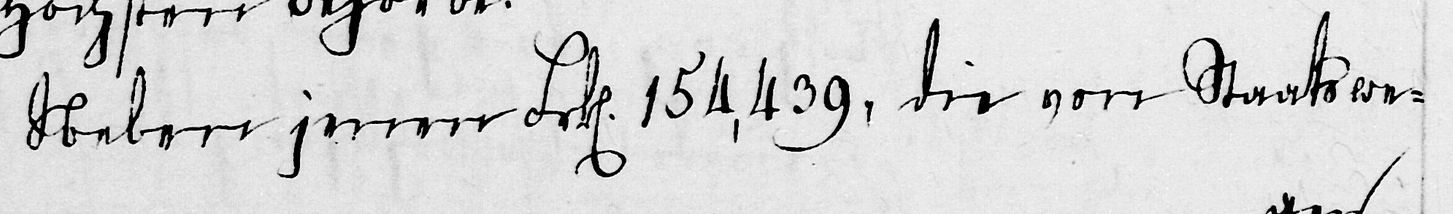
Neben jenen Frk[en]. 154,439, die von Staatswe-
